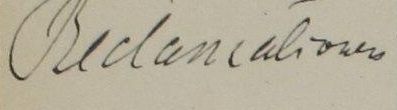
Reclamationen
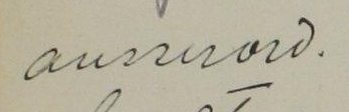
ausserord.
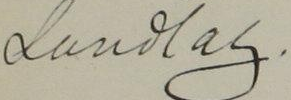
Landtag
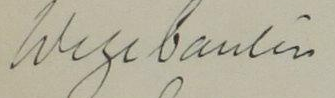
Wegebauten
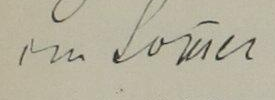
im Sommer
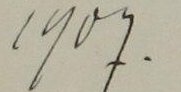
1907.
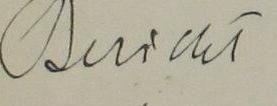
Bericht
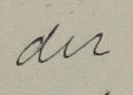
der
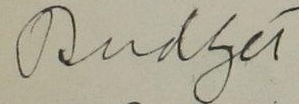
Budget
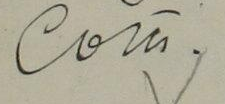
Comm.
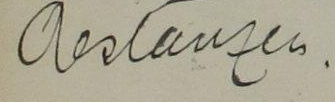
Restanzen
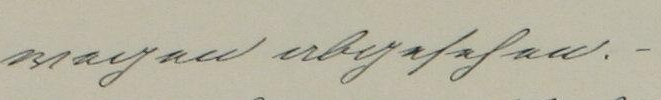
wegen abgesehen.
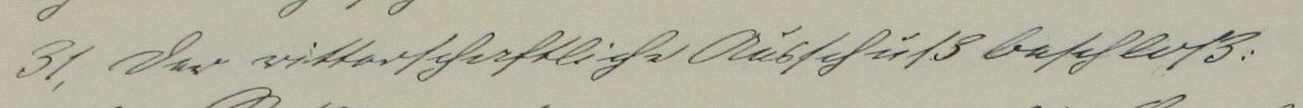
31. Der ritterschaftliche Ausschuß beschloß:
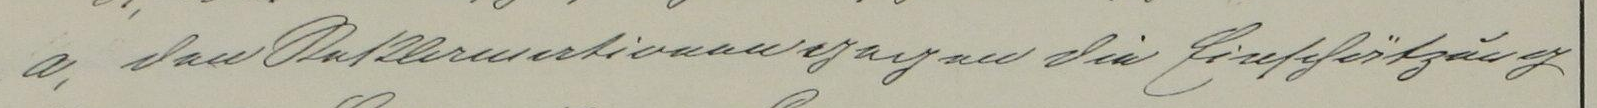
a. den Reklamationen gegen die Einschätzung
